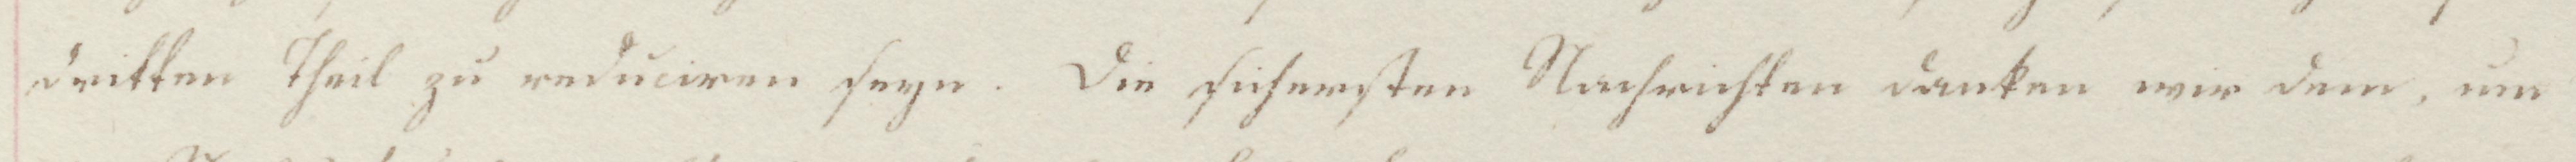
dritten Theil zu reduciren seyn. Die sichersten Nachrichten danken wir dem, um
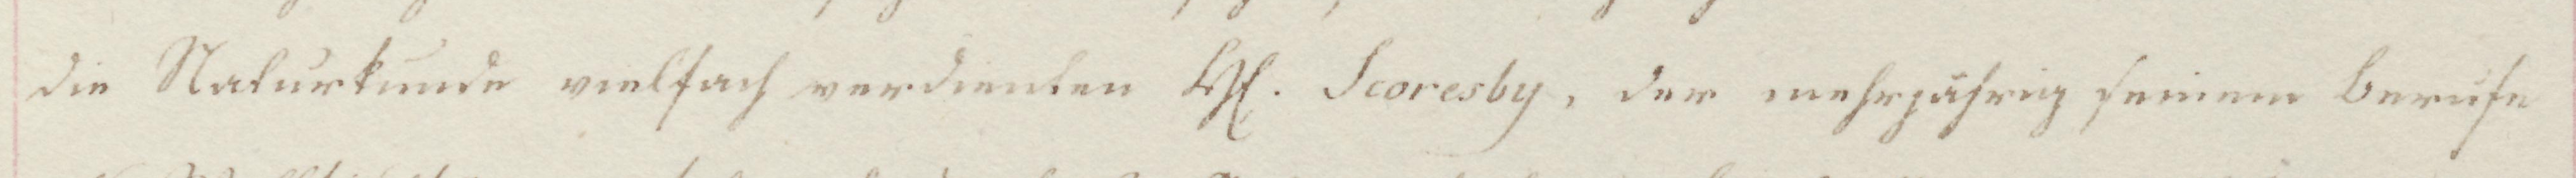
die Naturkunde vielfach verdienten H￼. Scoresby, der mehrjährig seinem Berufe
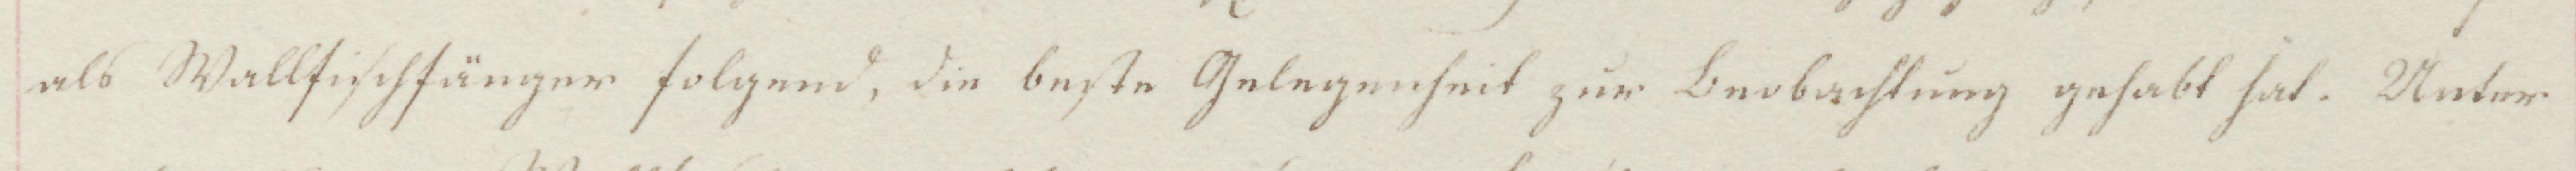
als Wallfischfänger folgend, die beste Gelegenheit zur Beobachtung gehabt hat. Unter
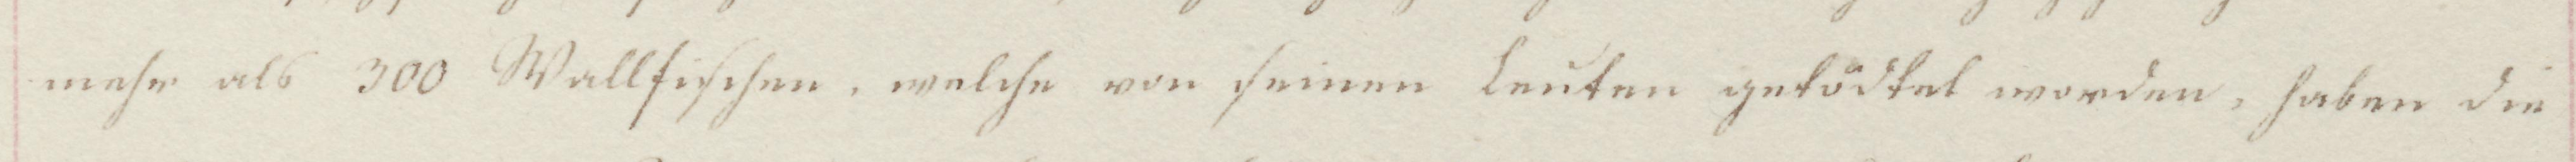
mehr als 300 Wallfischen, welche von seinen Leuten getödtet worden, haben die
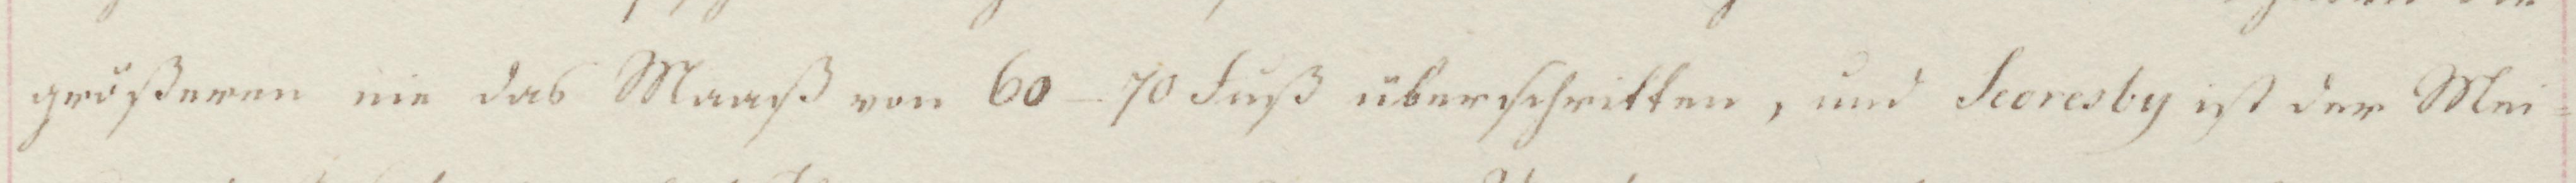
größeren nie das Maaß von 60–70 Fuß überschritten, und Scoresby ist der Mei-
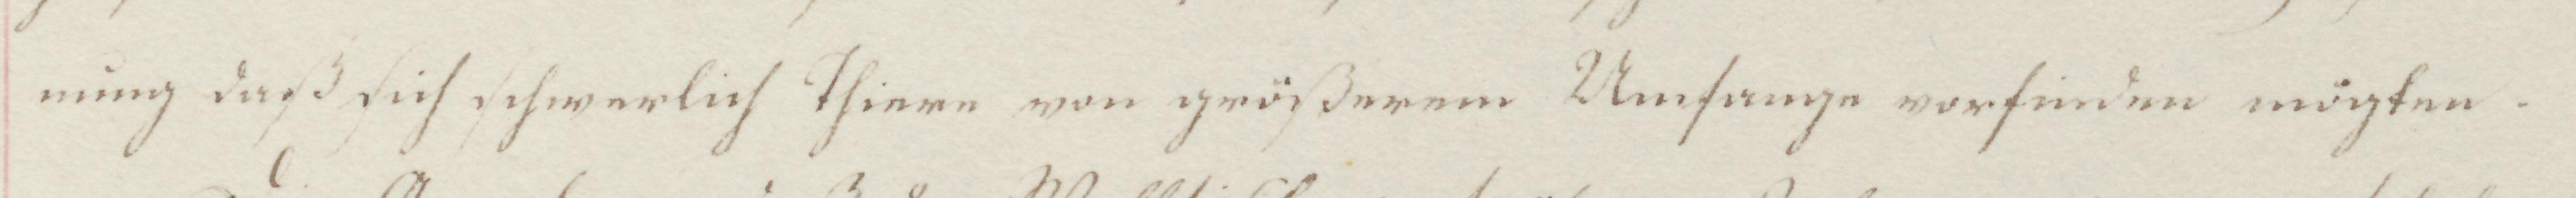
nung daß sich schwerlich Thiere von größerem Umfange vorfinden mögten.
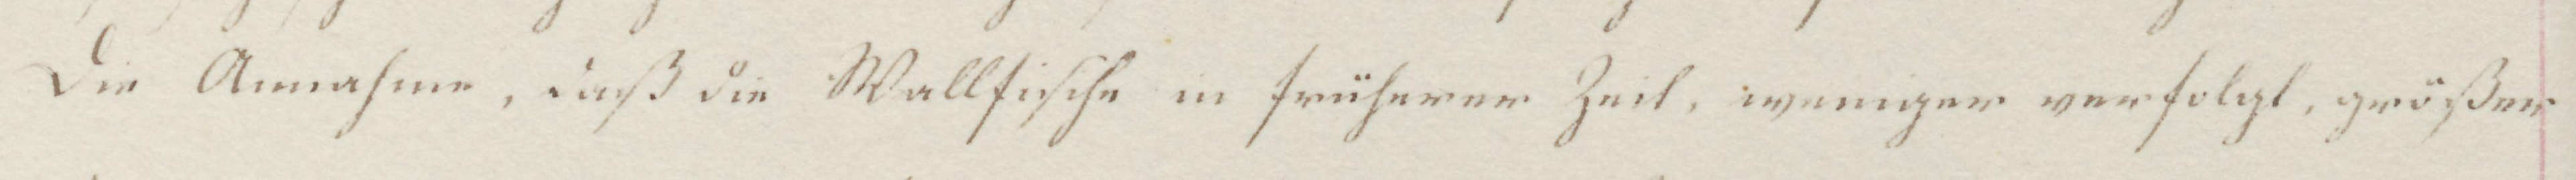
Die Annahme, daß die Wallfische in früherer Zeit, weniger verfolgt, größer
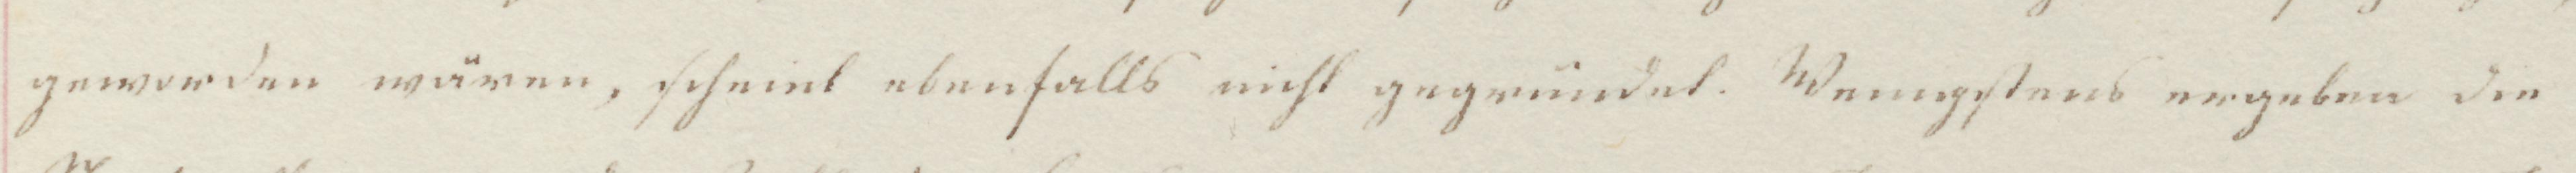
geworden wären, scheint ebenfalls nicht gegründet. Wenigstens ergeben die
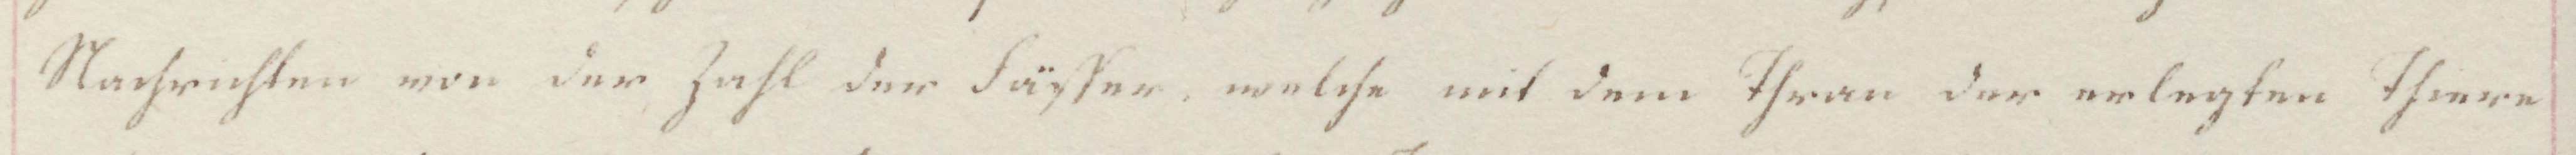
Nachrichten von der Zahl der Fässer, welche mit dem Thran der erlegten Thiere
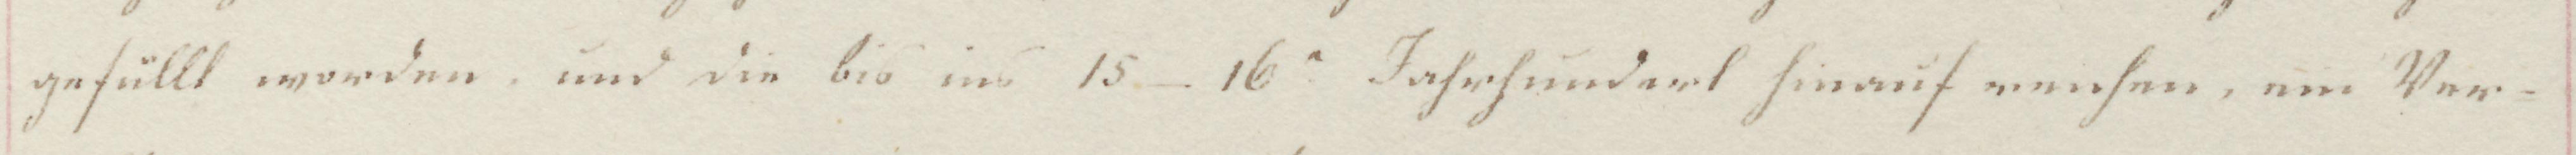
gefüllt worden, und die bis ins 15–16￼ Jahrhundert hinauf reichen, ein Ver-
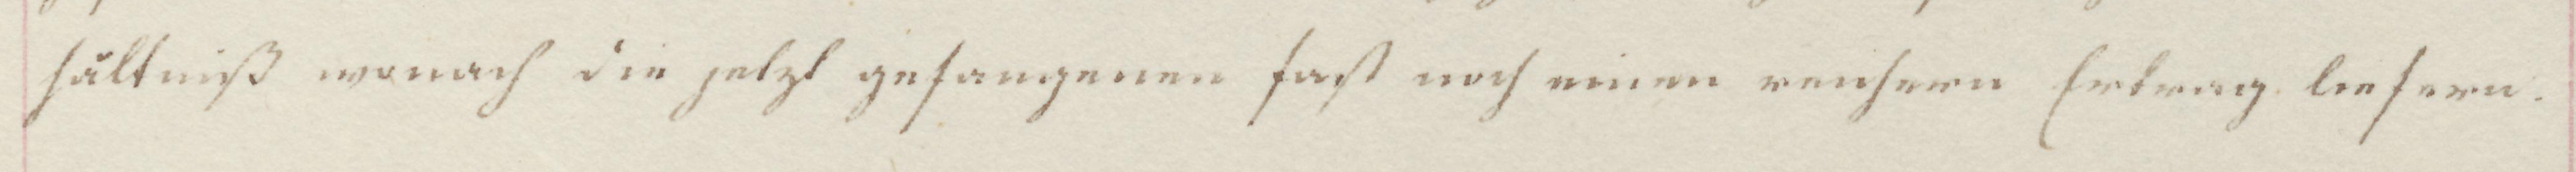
hältniß wonach die jetzt gefangenen fast noch einen reichern Ertrag liefern.
